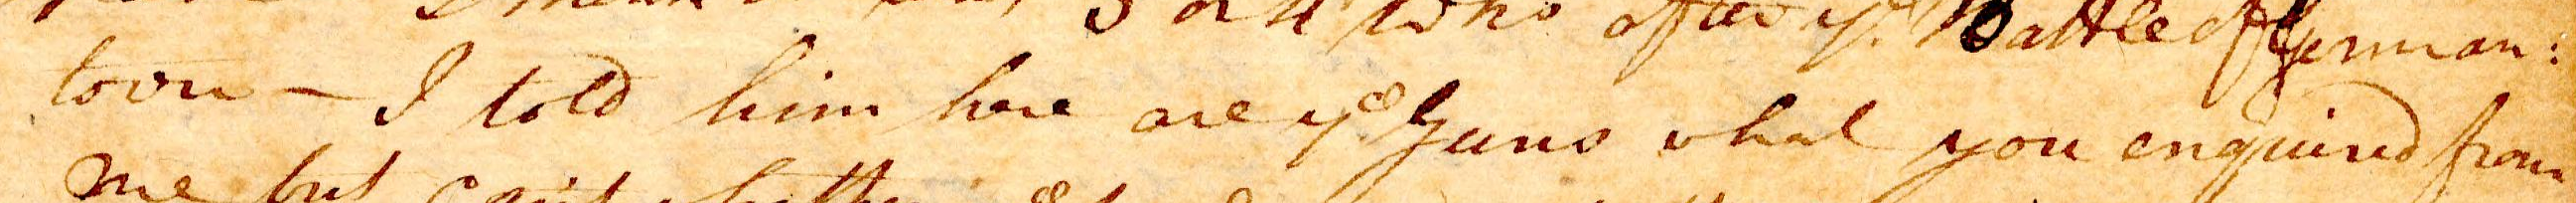town- I told him here are y^e Guns what you enquired from
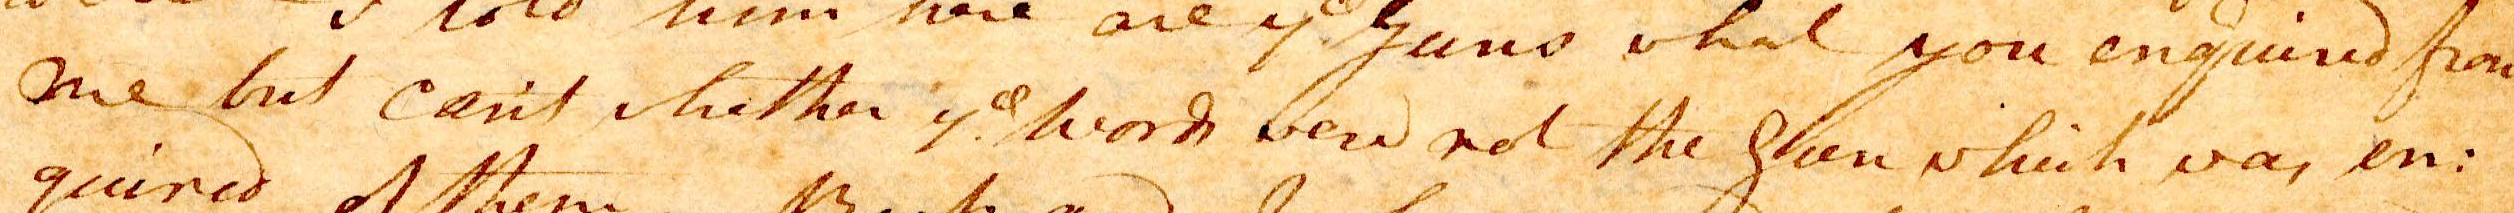me but can't whether y^e work were not the gun which was en-
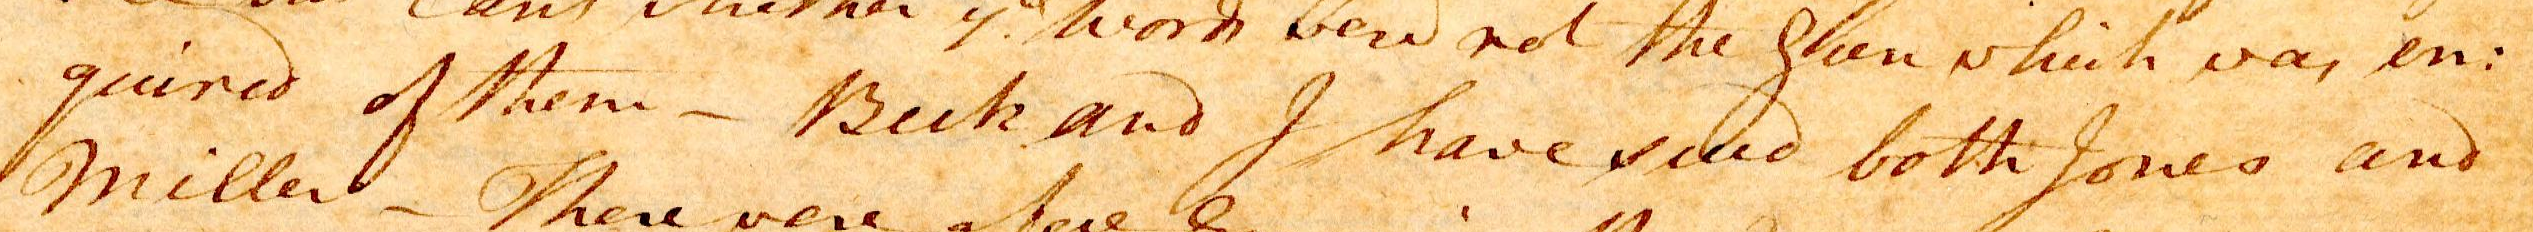quired of them- Beck and I have seed both Jones and
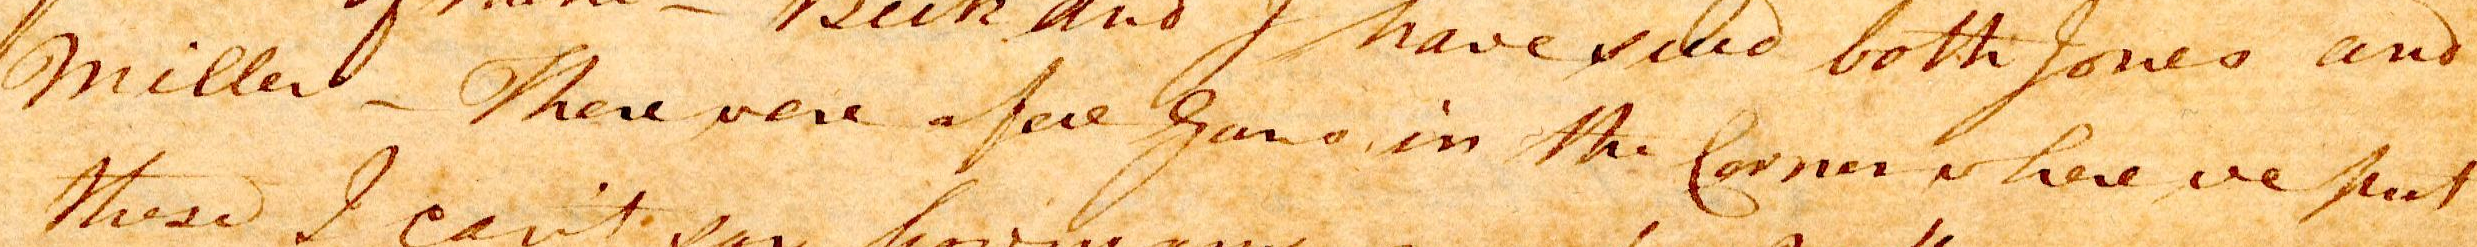Miller- There were a few guns in the corner in here we put
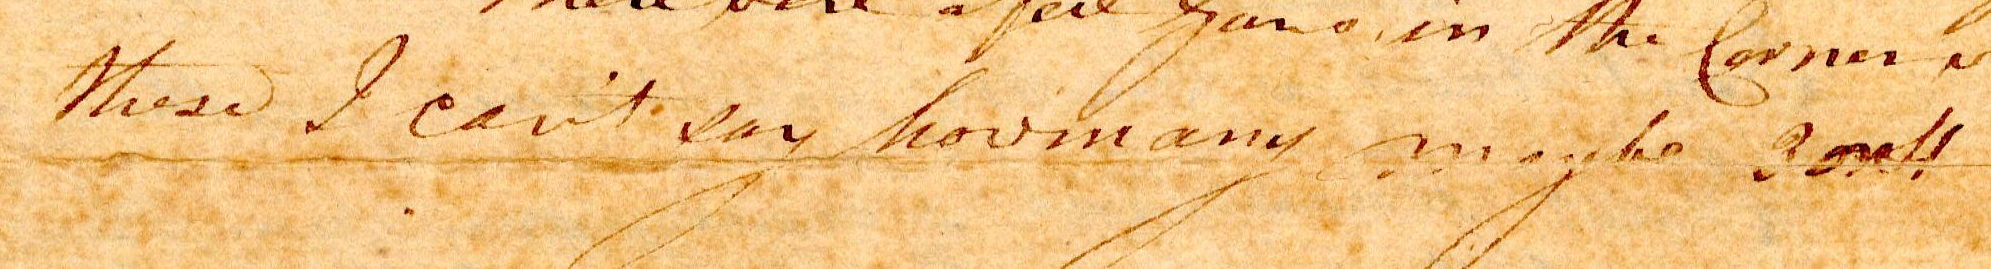these I can't say how many maybe 300
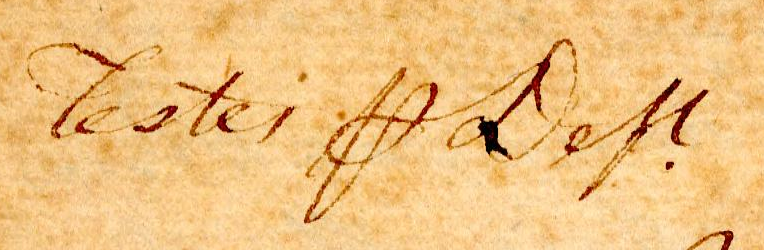Testes per Def^t.
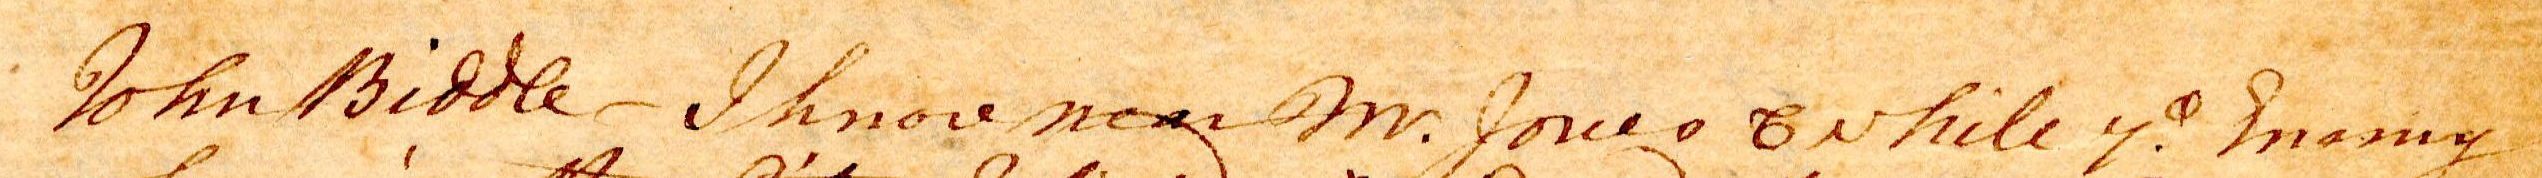John Biddle- I know near M^r. Jones & while y^e. Enemy
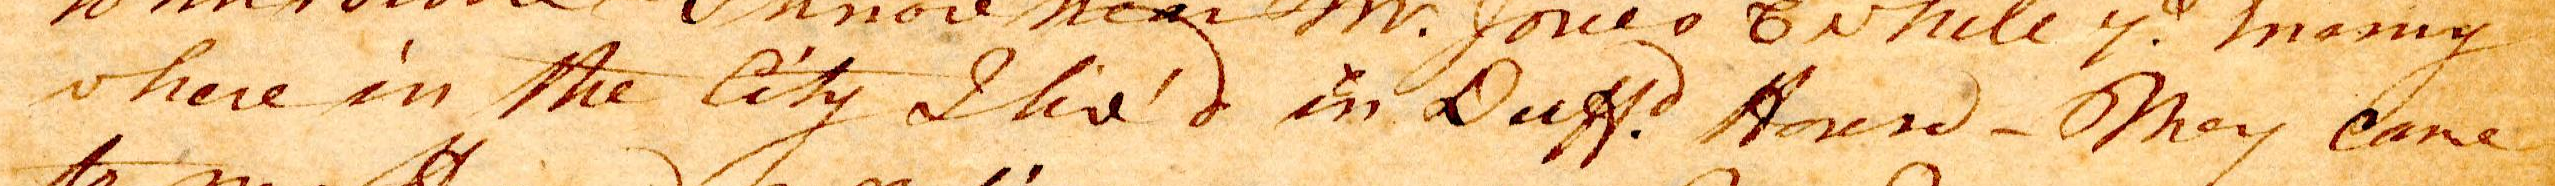where in the city I liv'd in Duff. House- They came
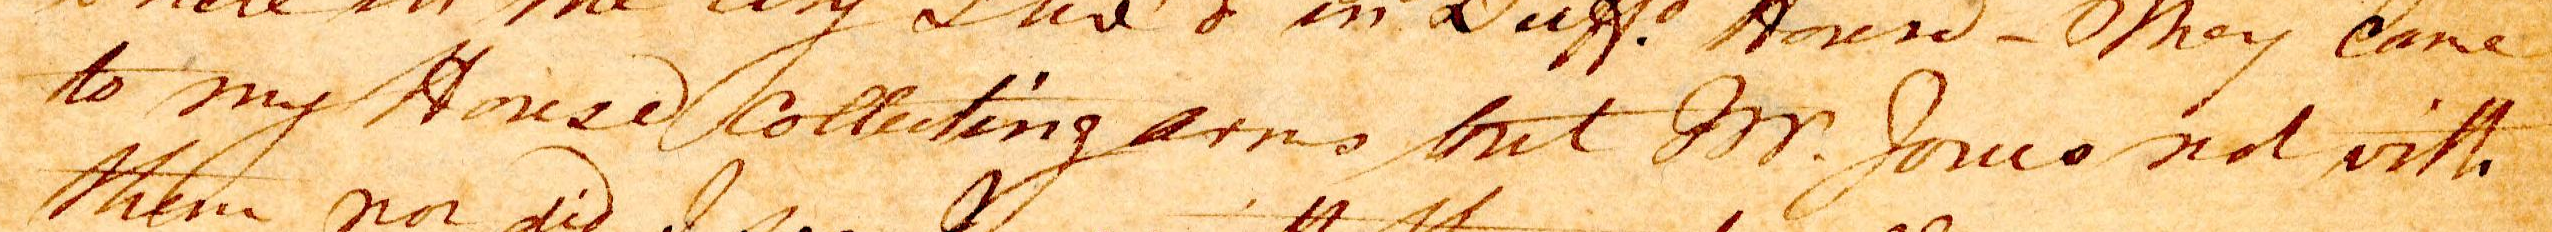to my House collecting arms but M^r. Jones not with
